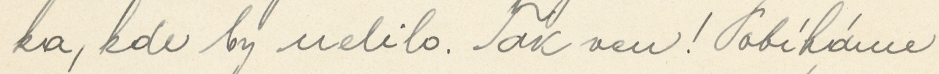ka, kde by nelilo. Tak ven! Pobíháme
